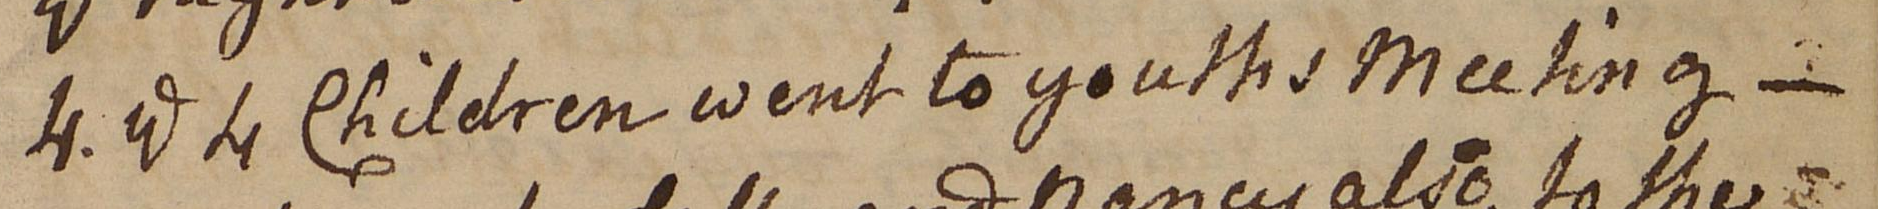4. y^e 4 Children went to youths Meeting-
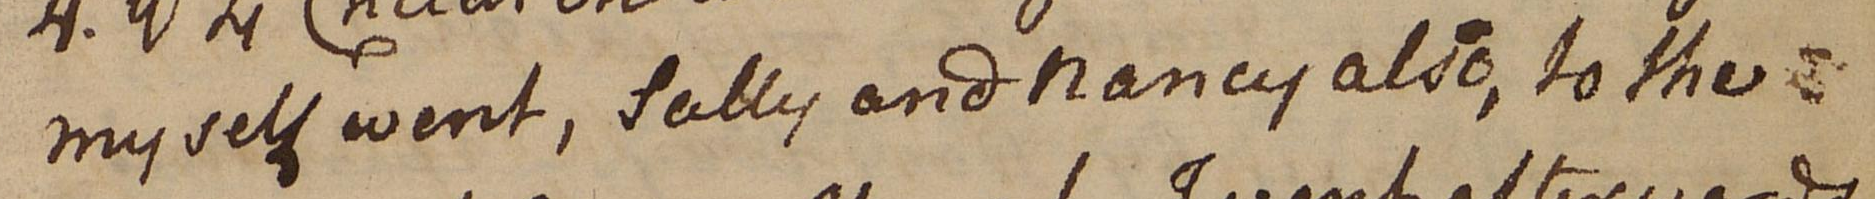my self went, Sally and Nancy also, to the
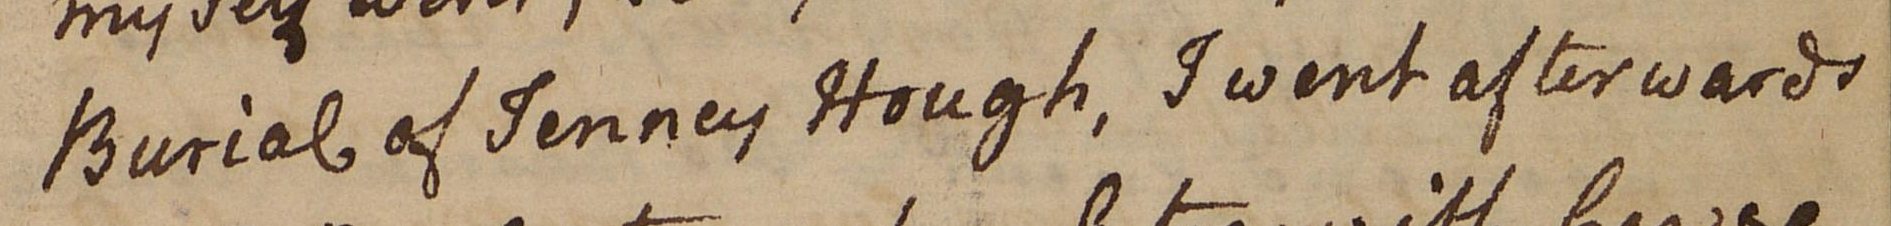Burial of Jenney Hough, I went after wards
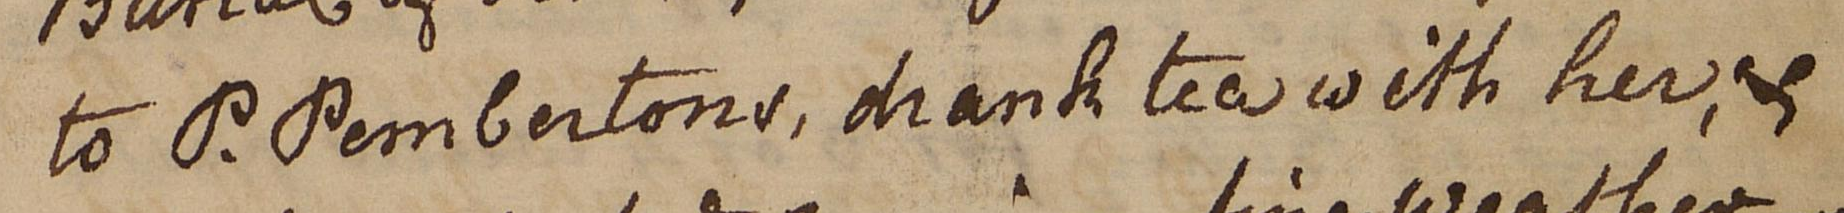to P. Pembertons, drank tea with her, &
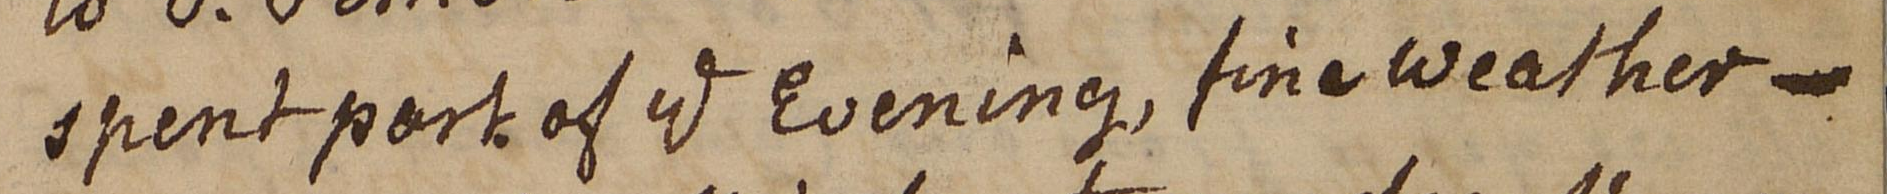spent part of y^e Evening, fine weather-
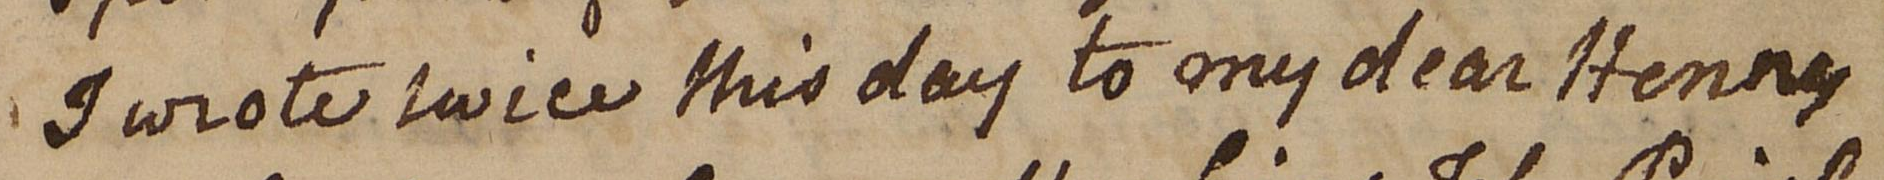I wrote twice this day to my dear Henry
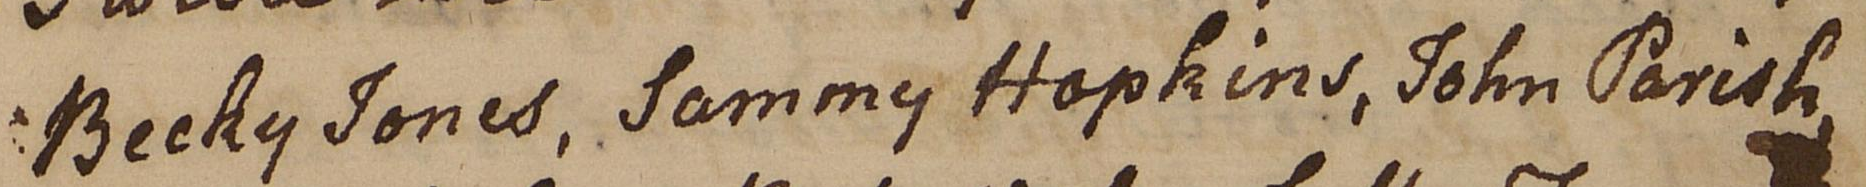Becky Jones, Sammy Hopkins, John Parish,
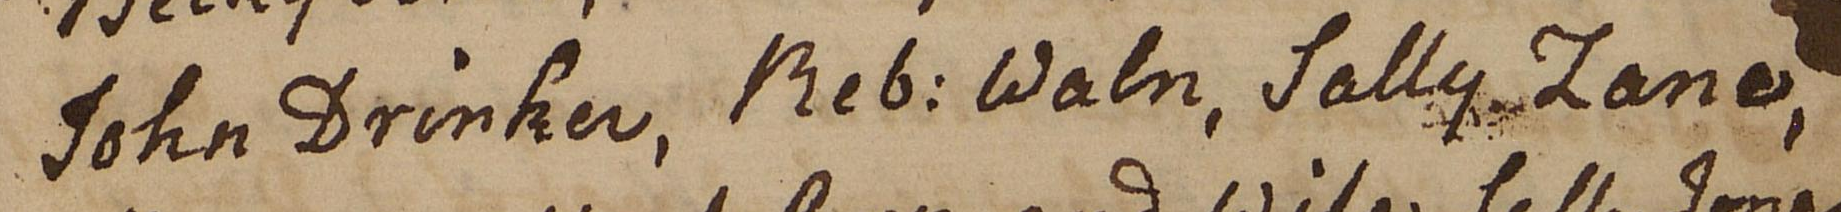John Drinker, Reb: Waln, Sally Zane,
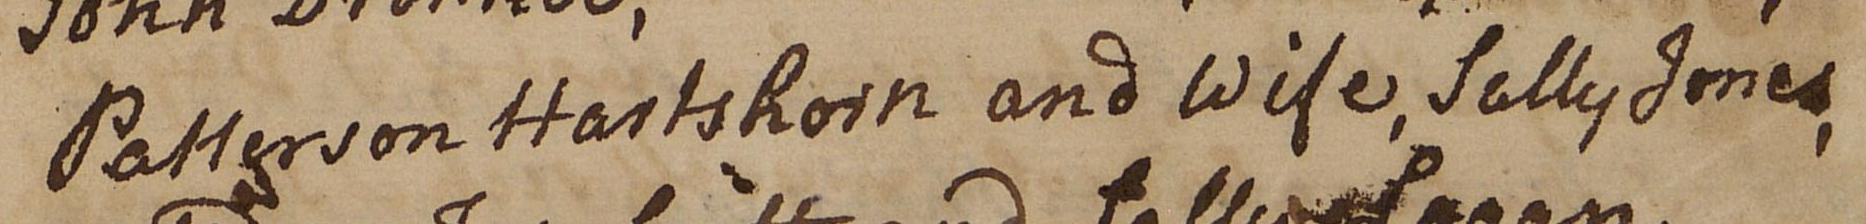Patterson Hartshorn and Wife, Sally Jones,
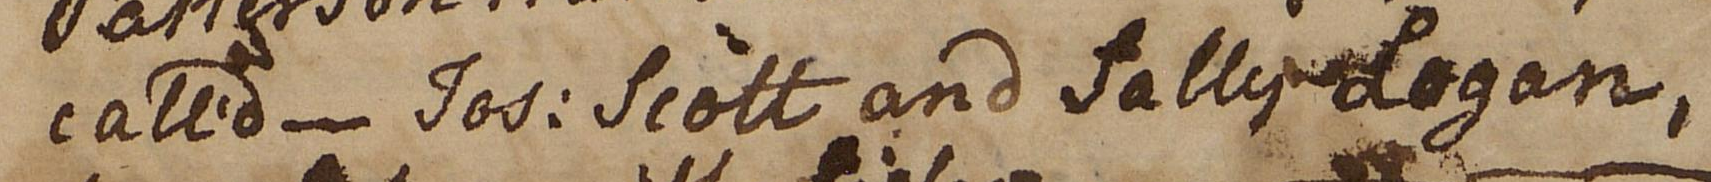call'd- Jos: Scott and Sally Logan,
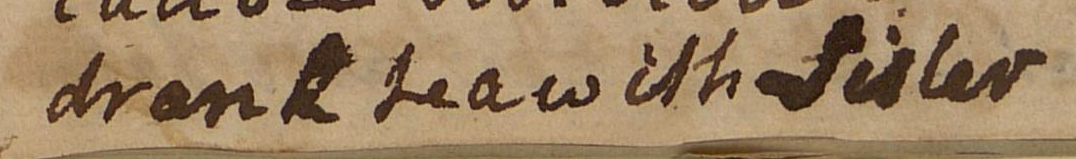drank tea with Sister
